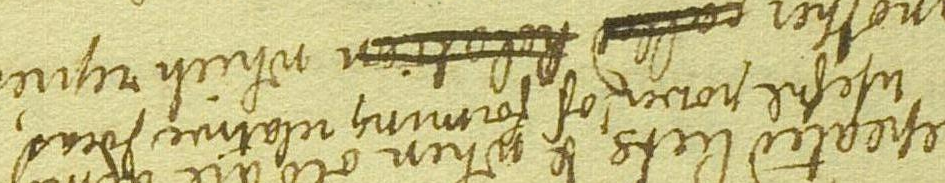useful power of forming relative Ideas,
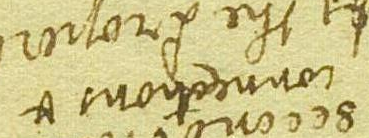connections &
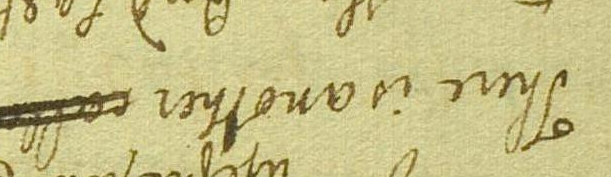There is another called
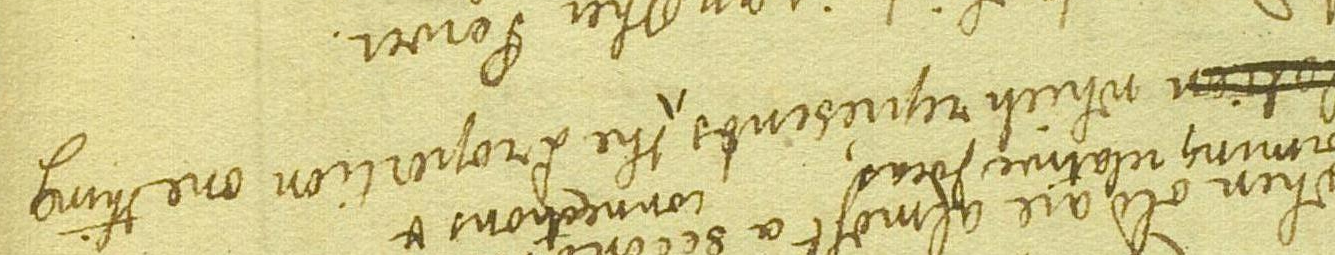Relation which represents ^ the Proportion one thing
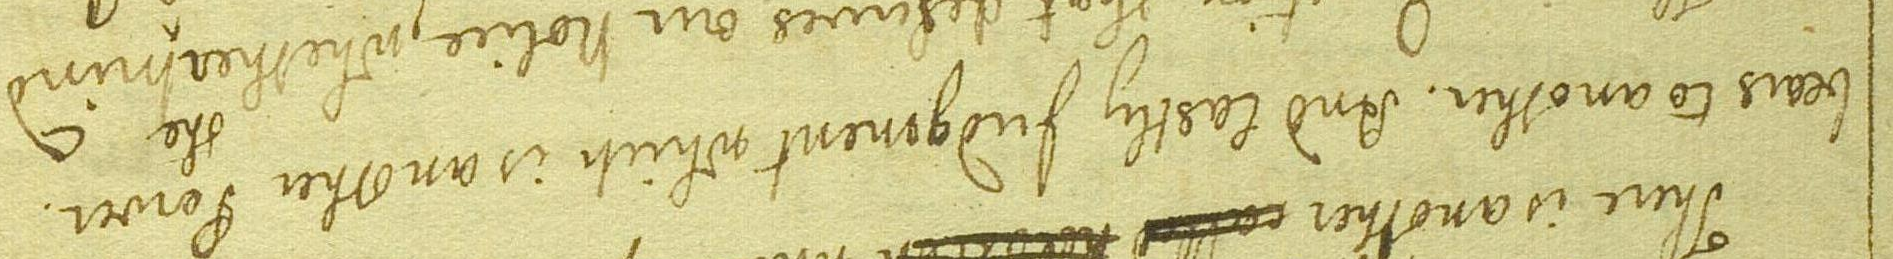bears to another. And lastly Judgement which is another Power.
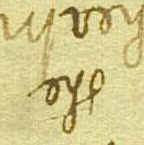the
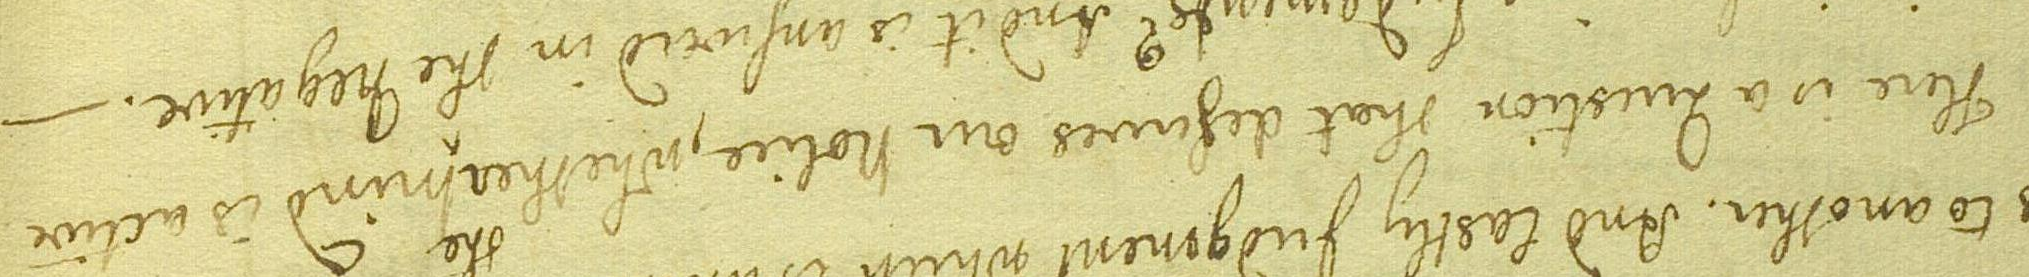There is a Question that deserves our Notice, whether ^ mind is active
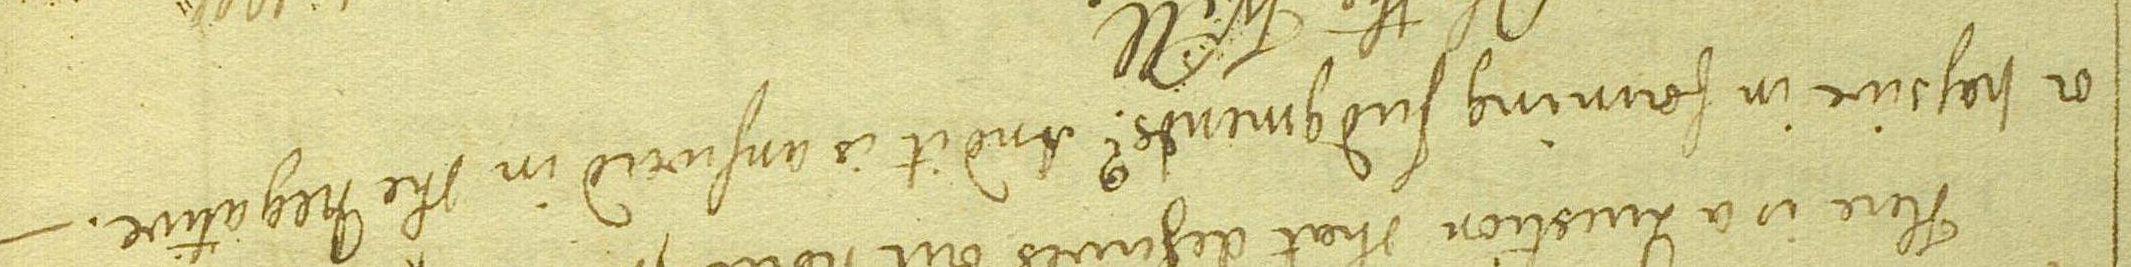or passive in forming Judgments? And it is answerd in the Negative.-
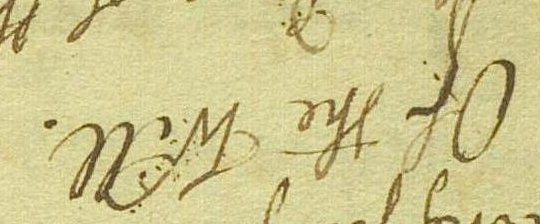Of the Will.
